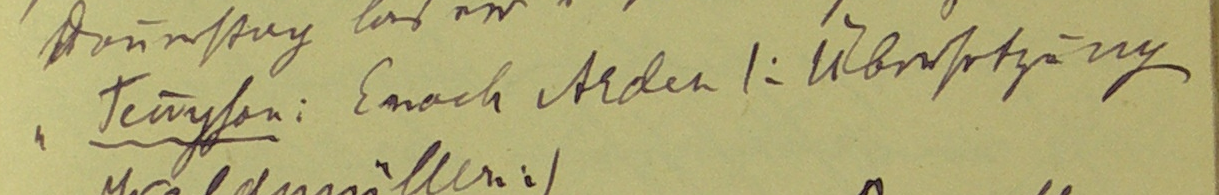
„ Tennyson „: Enoch Arden (: Übersetzung
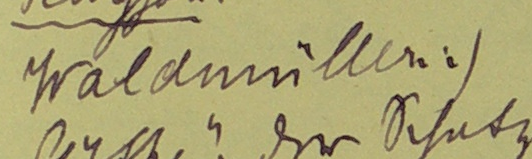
Waldmüller : )
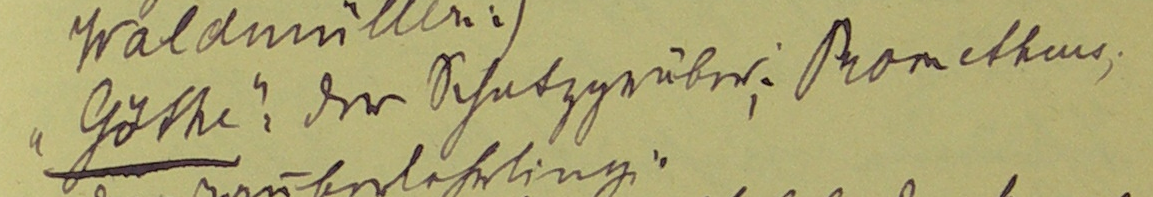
„Göthe“: Der Schatzgräber; , Prometheus,
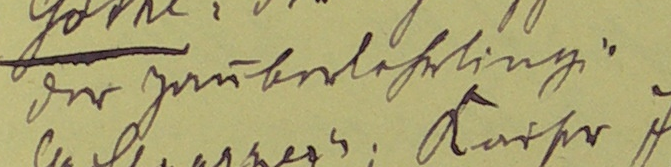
der Zauberlehrling“
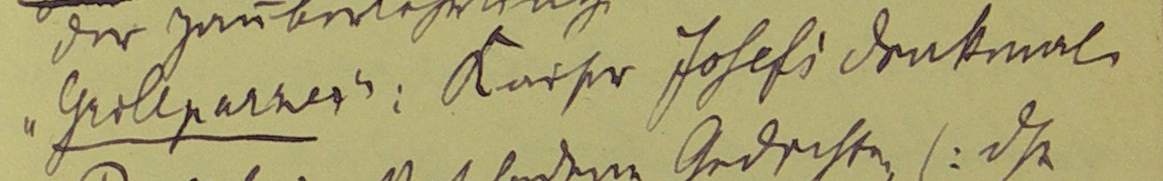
„Grillparzer“ . Kaiser Josefs Denkmal
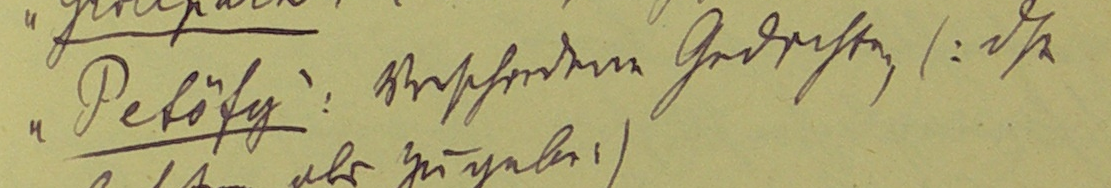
„Petöfy“ . Verschiedene Gedichte (: diese
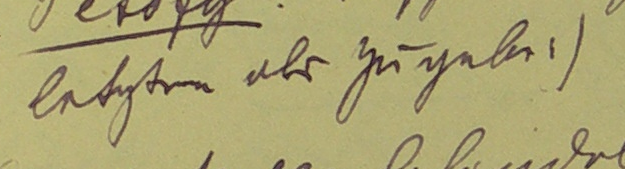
letzten als Zugabe : )
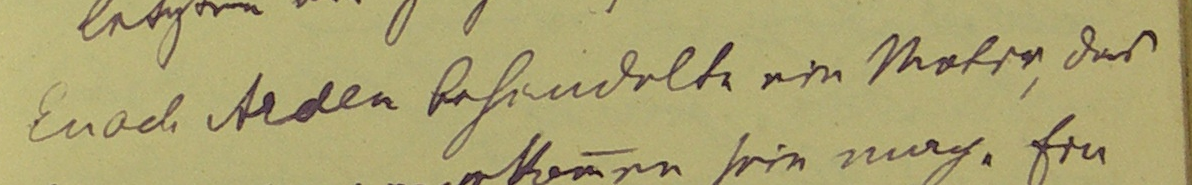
Enoch Arden behandelte ein Motiv, das
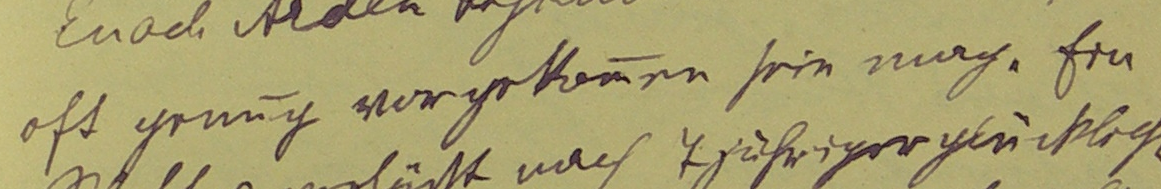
oft genug vorgekommen sein mag. Ein
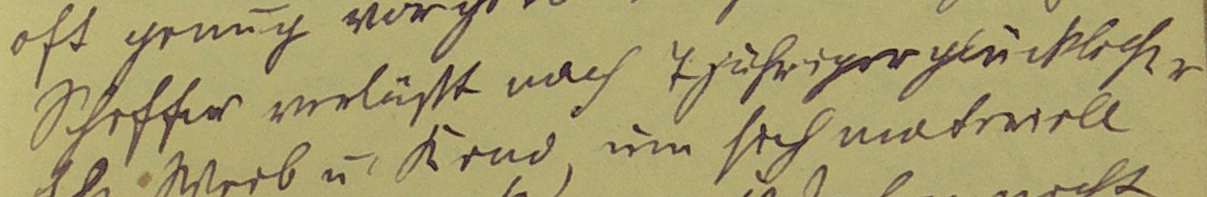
Schiffer verläßt nach 7-jähriger glücklichen
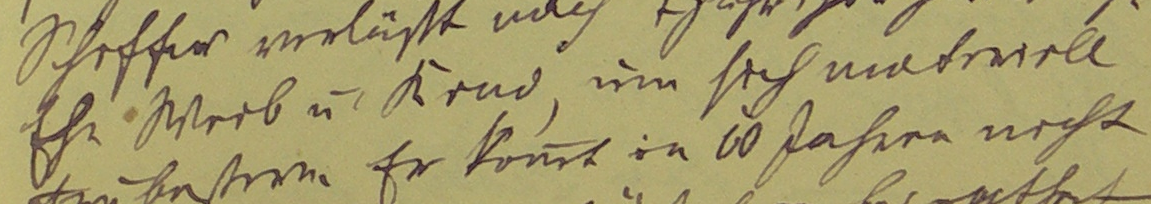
Ehe, Weib und Kind, um sich materiell
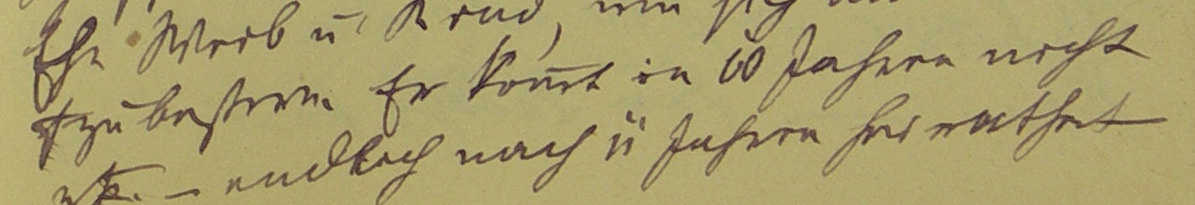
aufzu beßern. Er kommt in 60 Jahre nicht
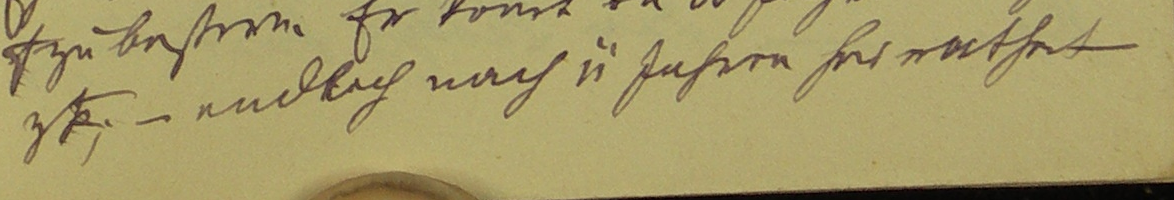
zurück; - endlich nach 11 Jahren heirathet
